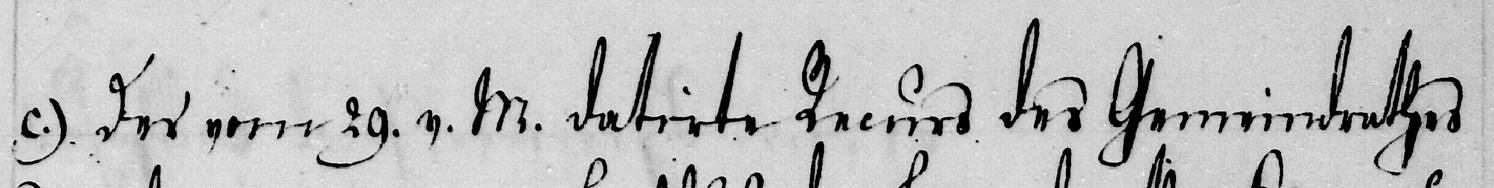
c.) Der vom 29. v. M. datirte Recurs des Gemeindrathes
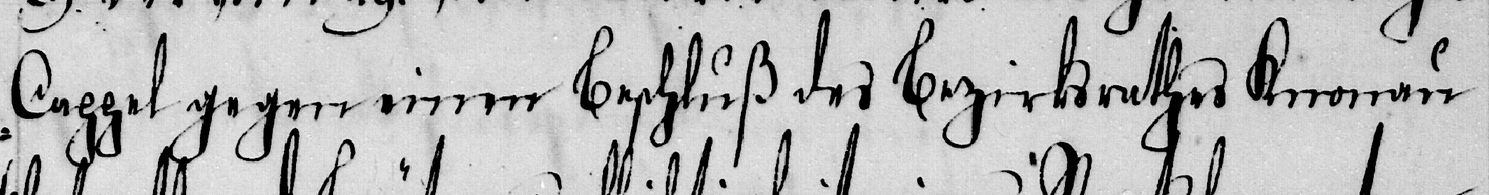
Cappel gegen einen Beschluß des Bezirksrathes Knonau
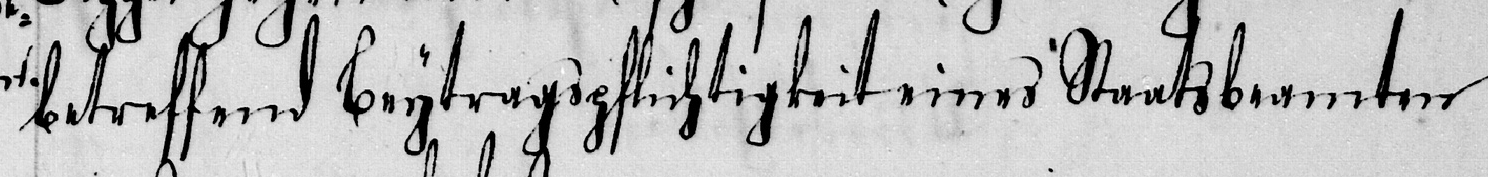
betreffend Beytragspflichtigkeit eines Staatsbeamten
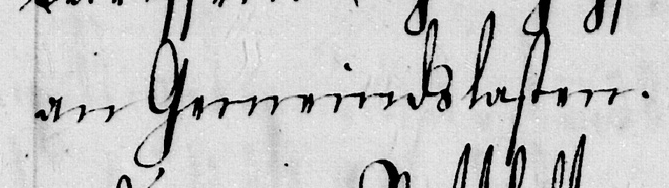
an Gemeindslasten.
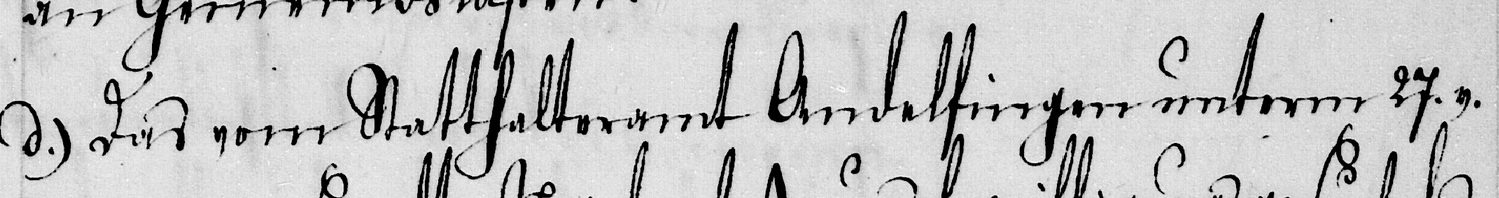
d.) Das vom Statthalteramt Andelfingen unterm 27. v.
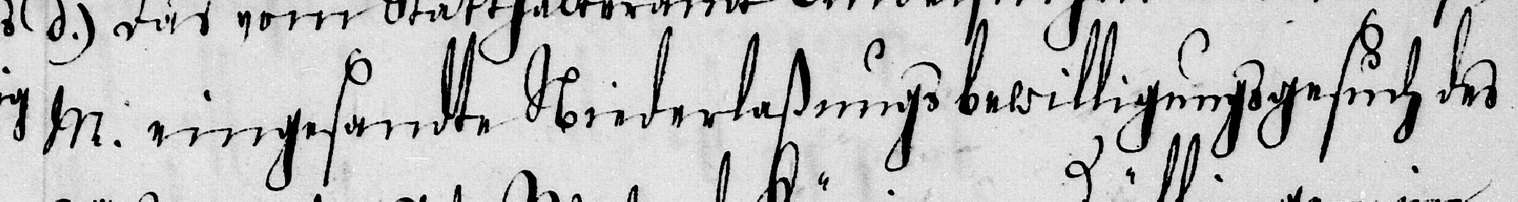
M. eingesandte Niederlaßungsbewilligungsgesuch des
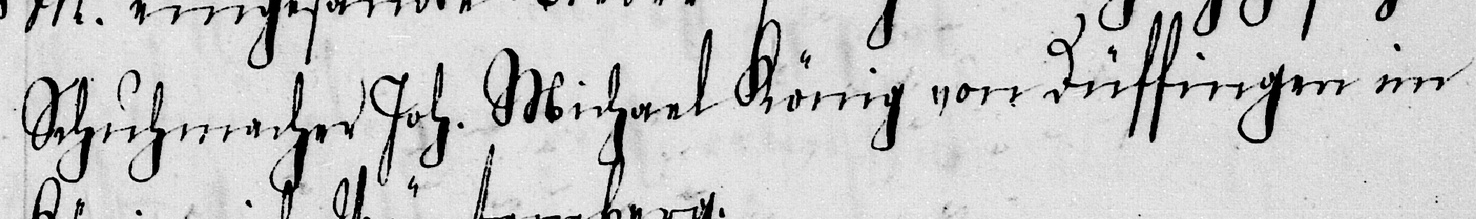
Schuhmacher Joh. Michael König von Düffingen im
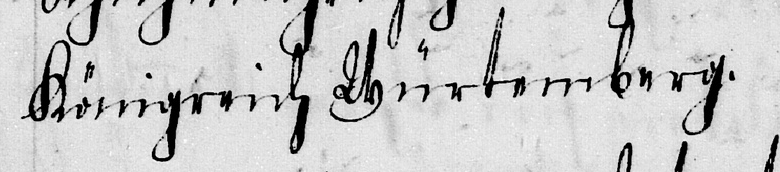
Königreich Würtemberg.
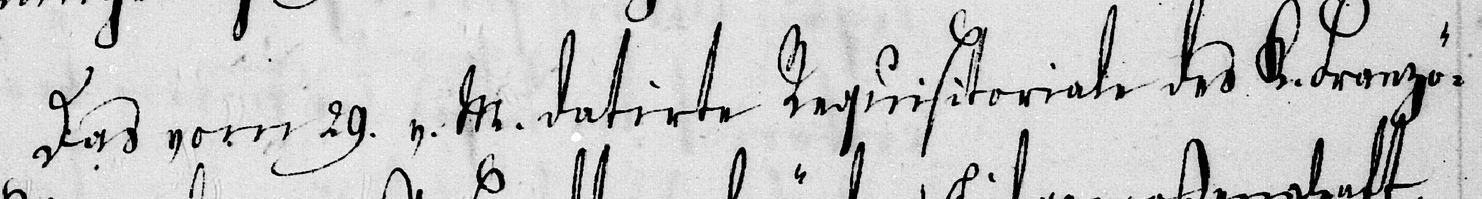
Das vom 29. v. M. datirte Requisitoriale des K. Franzö¬
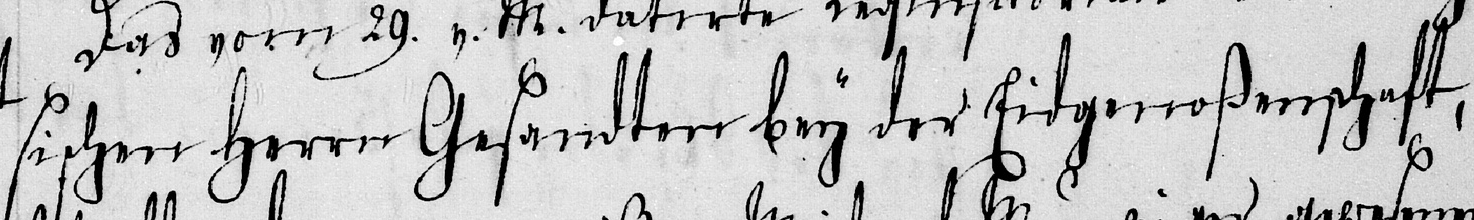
sischen Herrn Gesandten bey der Eidgenoßenschaft,
